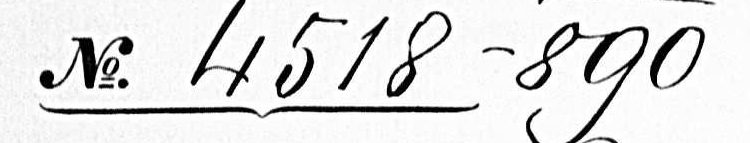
No. 4518-890
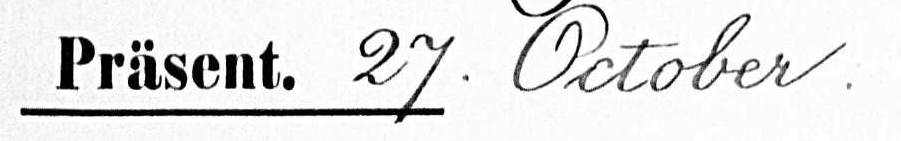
Präsent. 27. October.
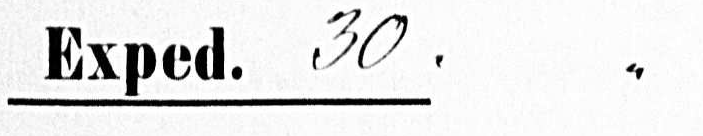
Exped. 30. October.
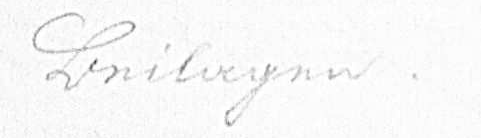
Beilagen.
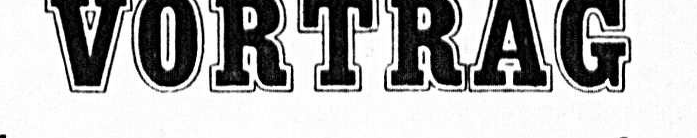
Vortrag
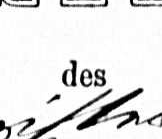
des
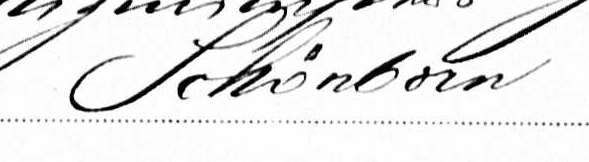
Schönborn
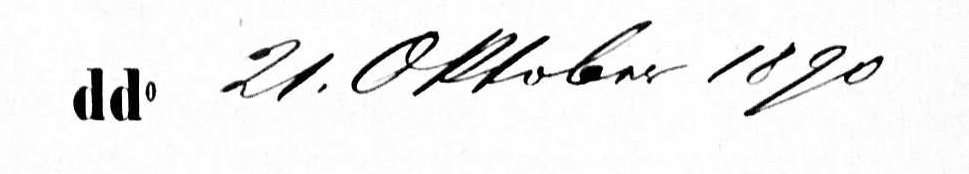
ddo 21. Oktober 1890
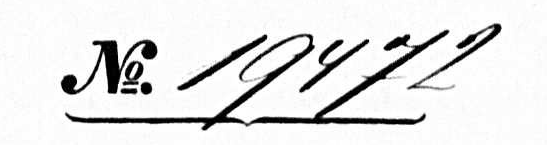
No. 19472
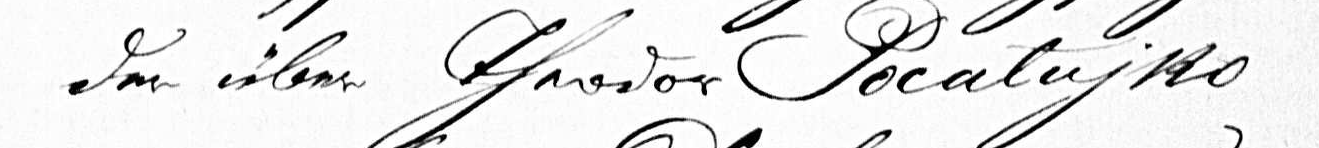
der über Theodor Pocatujko
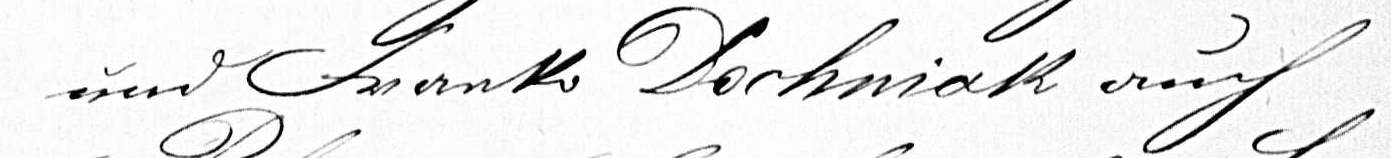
und Franko Dochniak auch
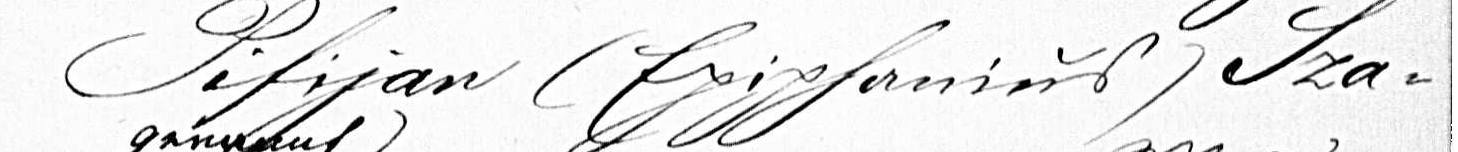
Pisijan (Epiphanius) Sza¬
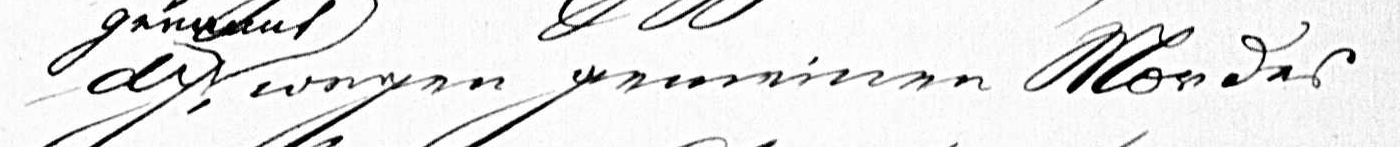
dy genannt, wegen gemeinen Mordes
